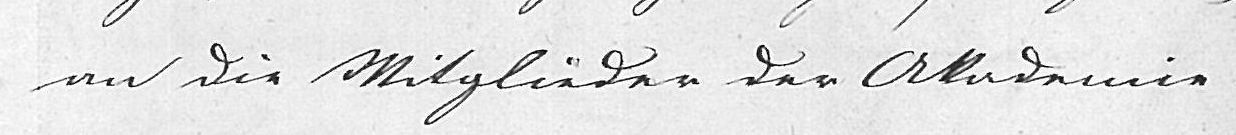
an die Mitglieder der Akademie
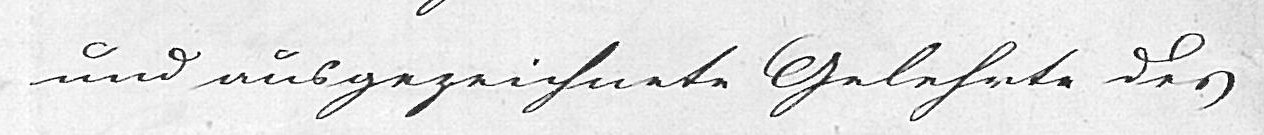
und ausgezeichneter Gelehrte des
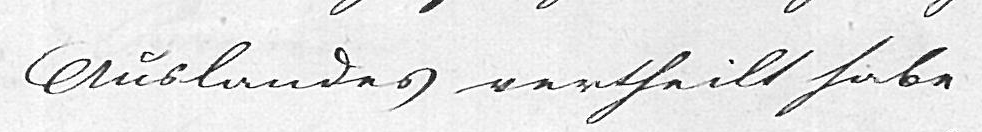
Auslandes vertheilt habe.
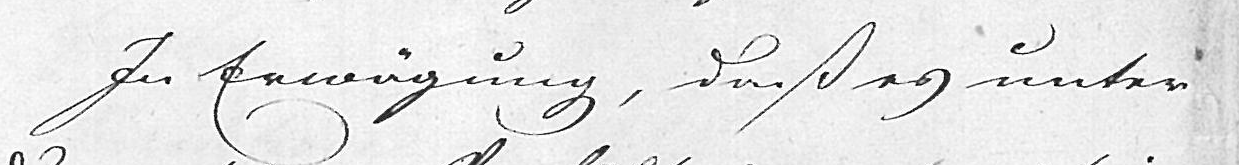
In Erwägung, daß es unter
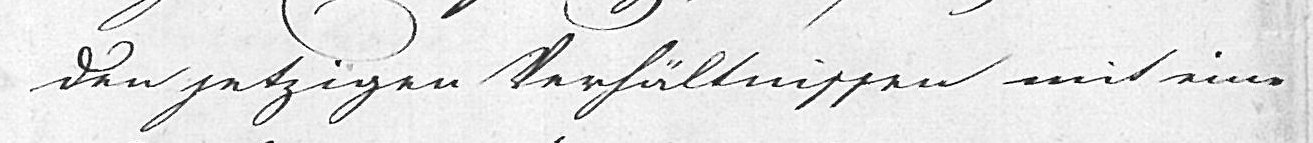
den jetzigen Verhältnissen mit eine
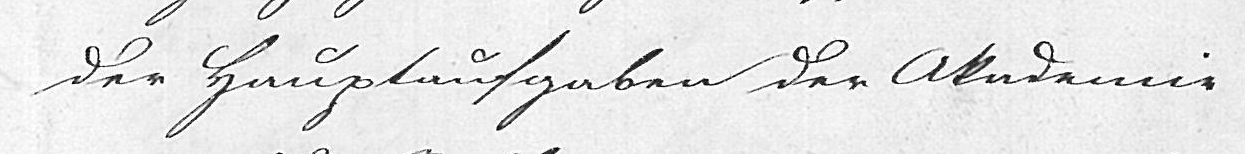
der Hauptaufgaben der Akademie
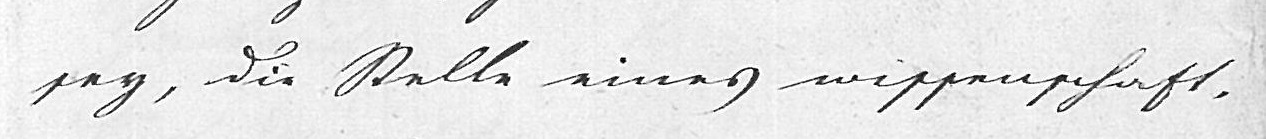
sey, die Stelle eines wissenschaft-
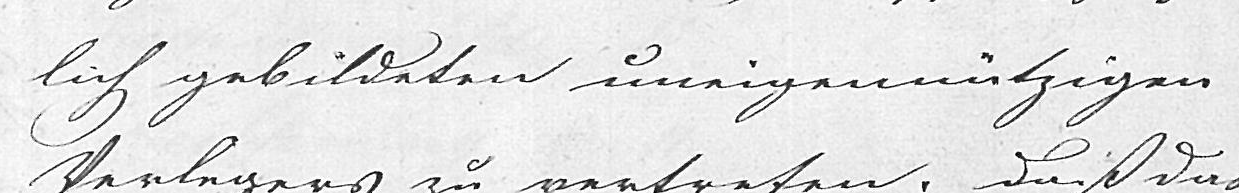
lich gebildeten uneigenützigen
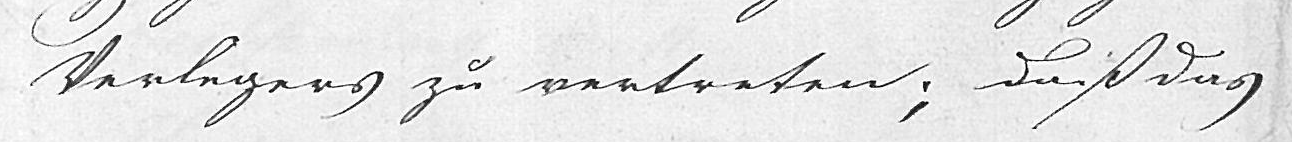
Verlegers zu vertreten; daß das
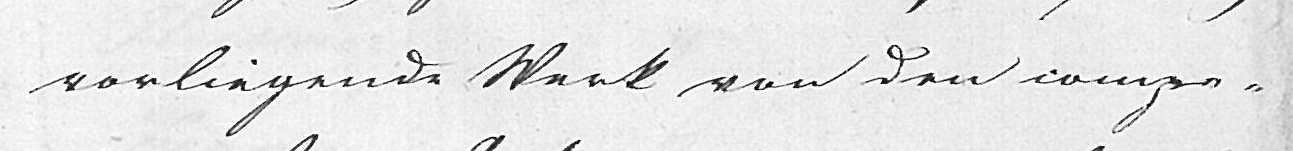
vorliegenden Wort von den compe-
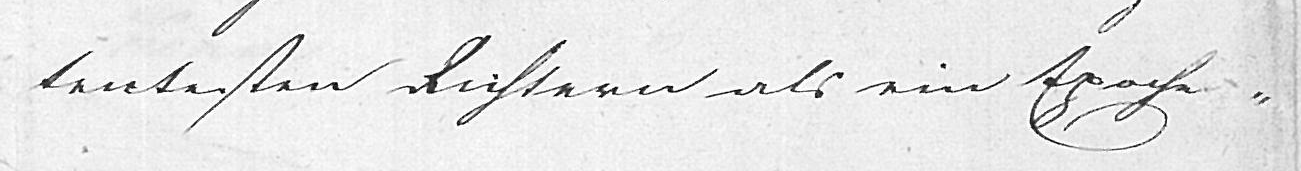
tentesten Richtern als ein Epoche-
